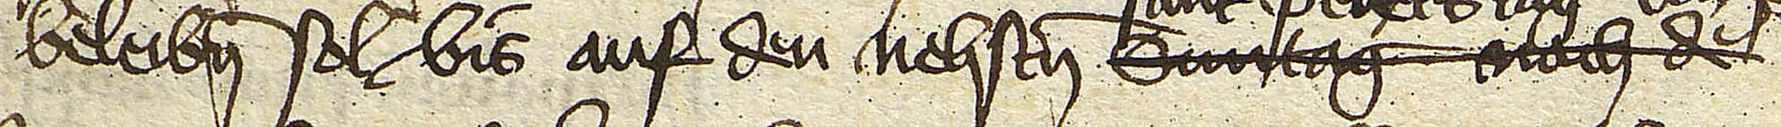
beleibn* ſol / bis auf den nehſtn* Suntag nach d*
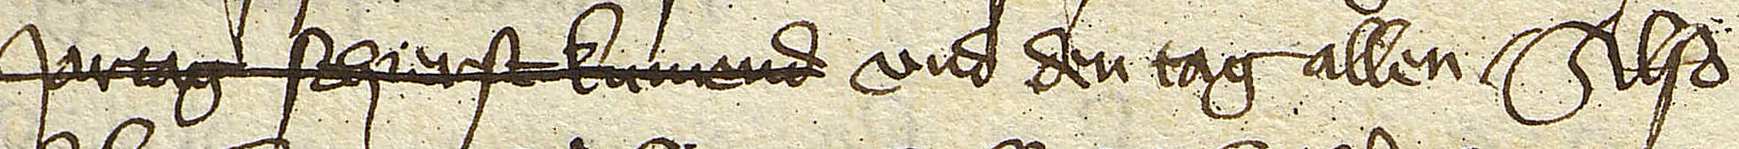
Iartag ſchierſt kumend vnd den tag allen / Alſo
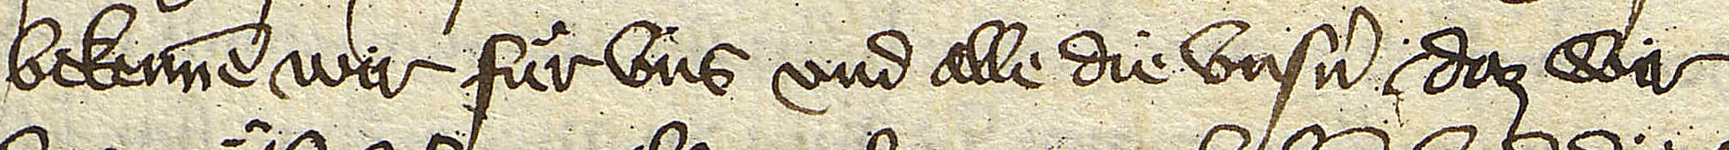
bekenne* wir für vns vnd alle die vnſn* / daʒ wir
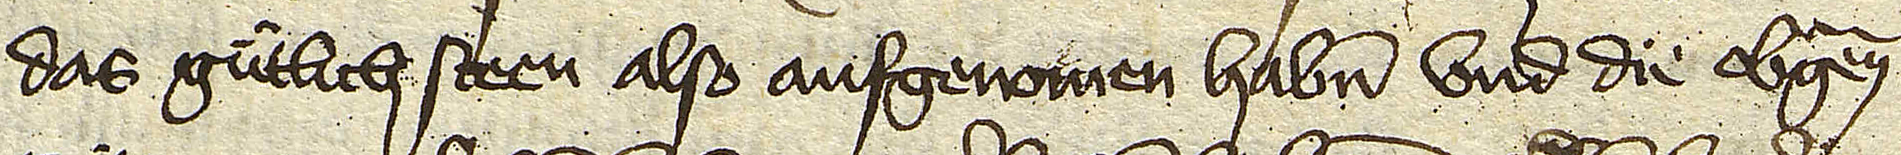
das gütlich ſteen alſo aufgenomen habn* vnd die obgen*
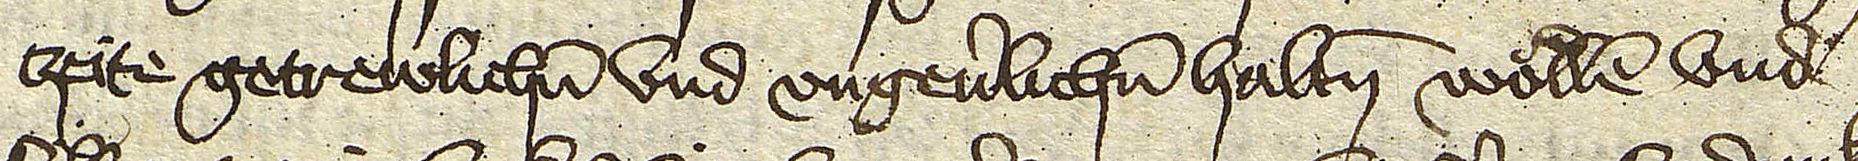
cʒeite getrewlichn* vnd vngeu*lichn* haltn* wölle* vnd
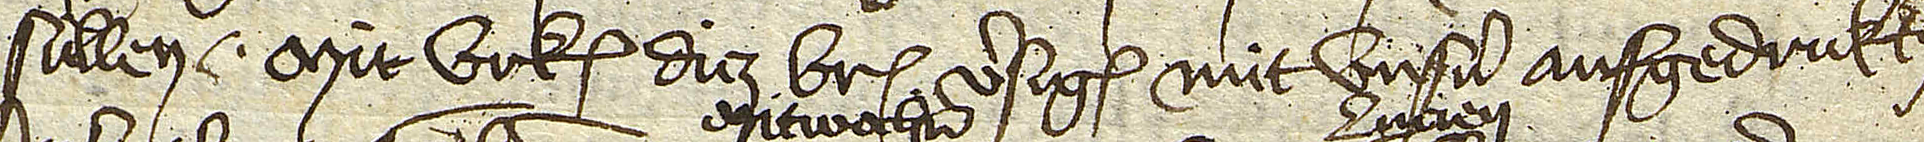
ſüllen / . Mit vrk* dicʒ br* v*ſig* mit vnſn* aufgedruktn*
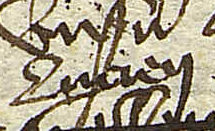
Lucien
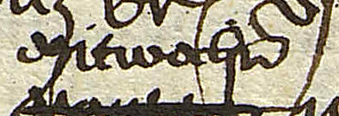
Mitwochn*
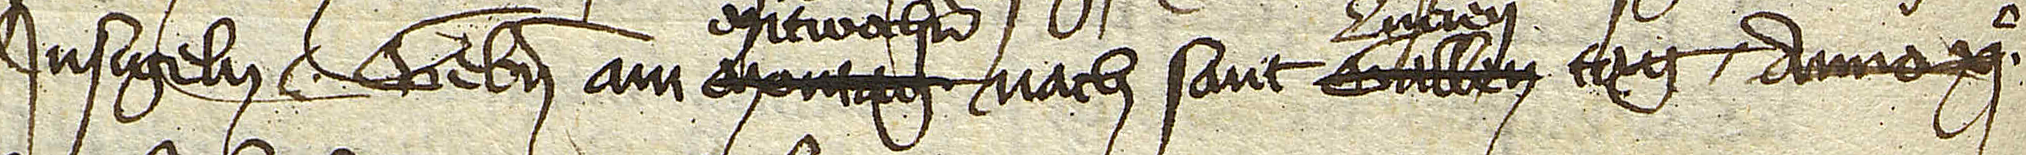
Inſigeln / . Gebn* am Montag nach ſant Gallen tag / Anno xi* .
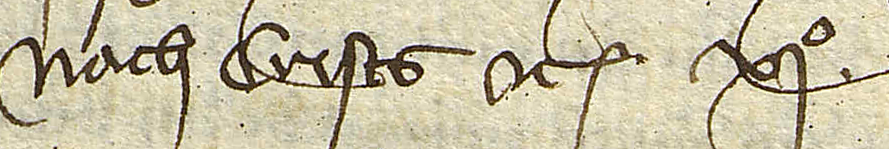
nach Criſts ec* xi* .
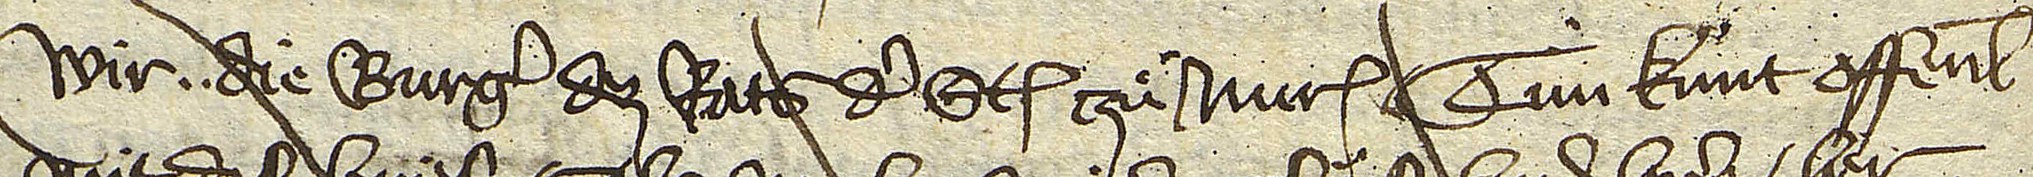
Wir ~ die Burg* deʒ Rats d* St* cʒü Nur* / Tün künt offenl*
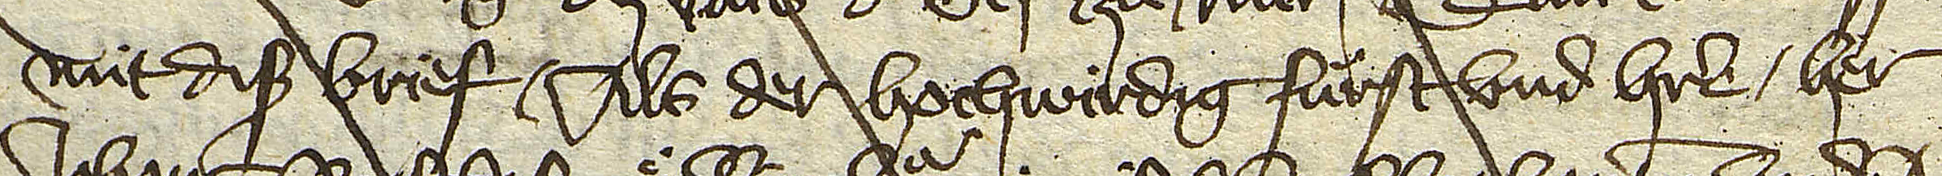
mit diſʒ brief / Als der hochwirdig fürſt vnd hr*e / her
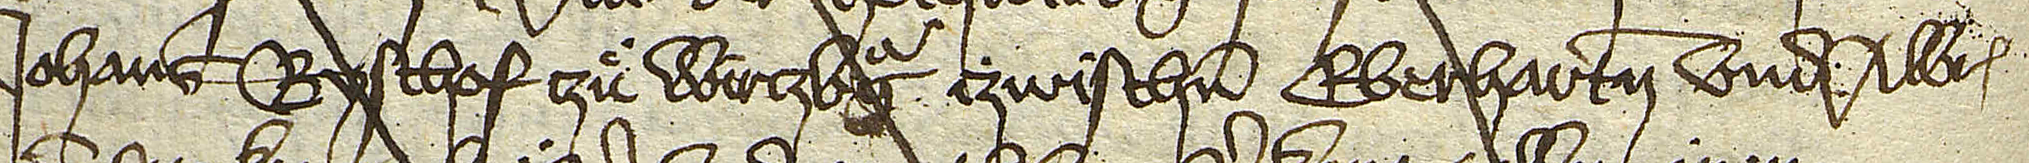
Iohans Byſchof cʒü wircʒb*g cʒwiſchn* Eberhartn* vnd Albr*
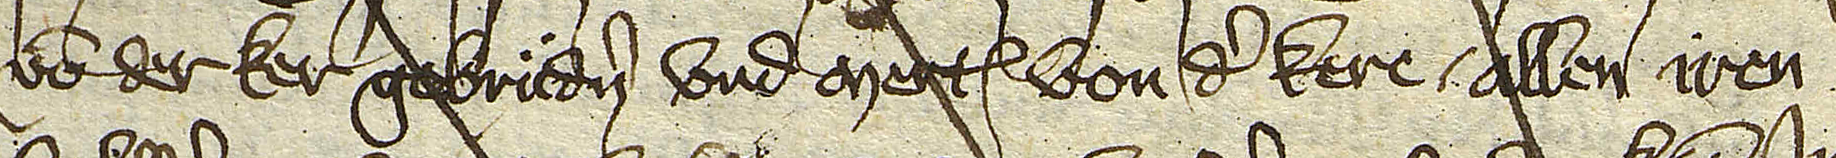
vo* der ker gebrüdn* vnd Mert* von d* kere / allen iren
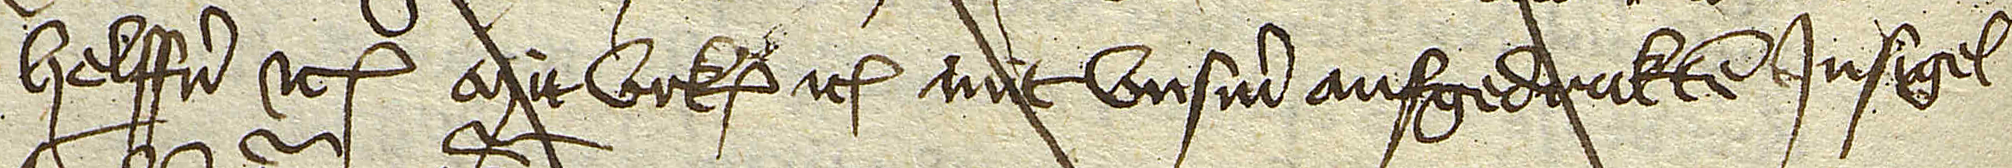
helffn* ec* Mit vrk* ec* mit vnſm* aufgedrukte* Inſigel
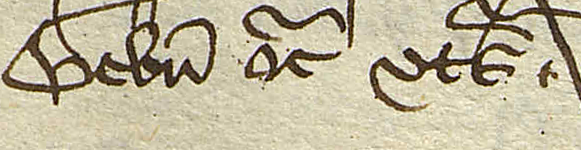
Gebn* ec* vts* .
